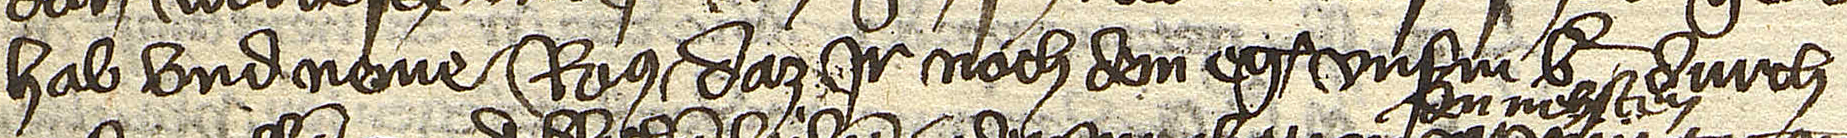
hab vnd neme / Ro* / daʒ Ir noch dem eg* vnſ*m b* durch
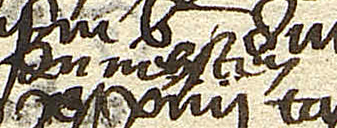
den nehſten
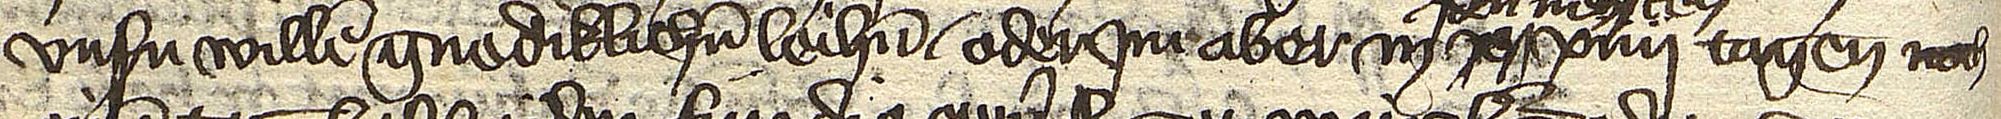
vnſ*n wille* gnediklichn* leihn* / oder Im aber in %% xiiii tagen noch
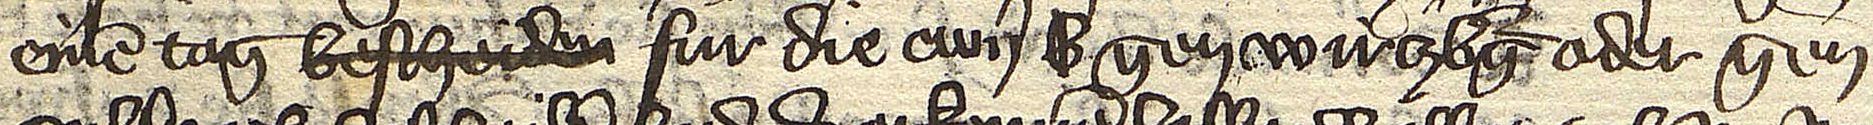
eine* tag beſcheiden für die ewn* b gen wircʒb*g oder gen
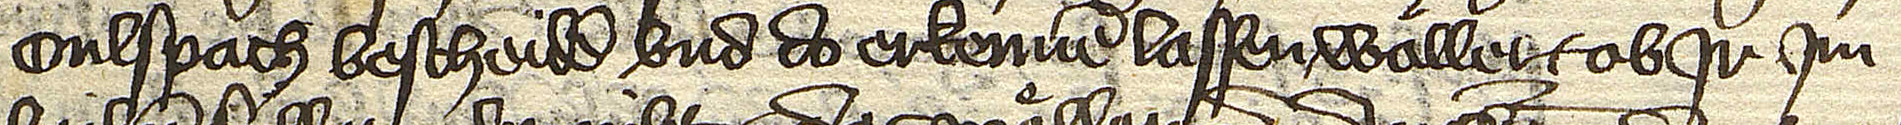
Onlſpach beſcheid* vnd do erkenne* laſſen / wöllet / ob Ir Im
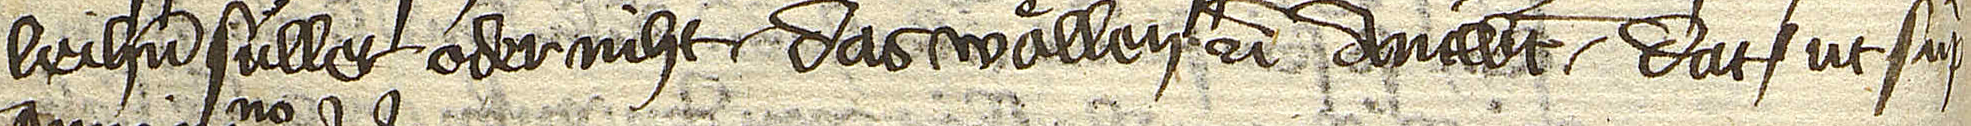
leihn* ſüllet oder niht / das wöllen ec* Antw*t / dat* ut ſup*
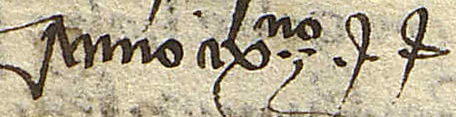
Anno ix* % . § §
